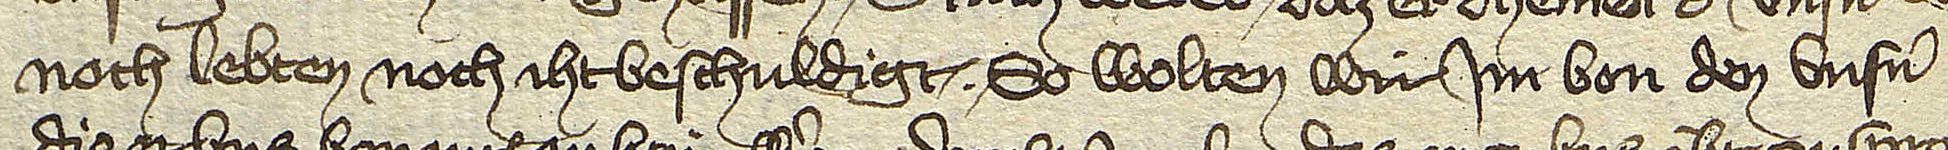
noch lebten noch iht beſchuldigt . / So wolten wir Im von den vnſn*
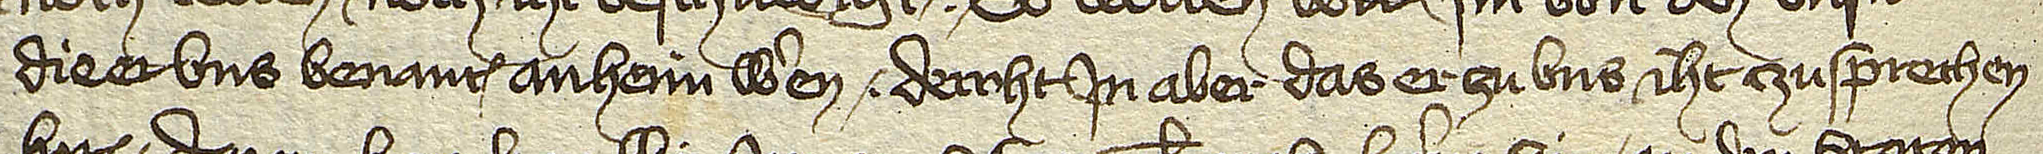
die er vns benant* anheim w*en / . dewcht In aber das er cʒu vns iht cʒuſprechen
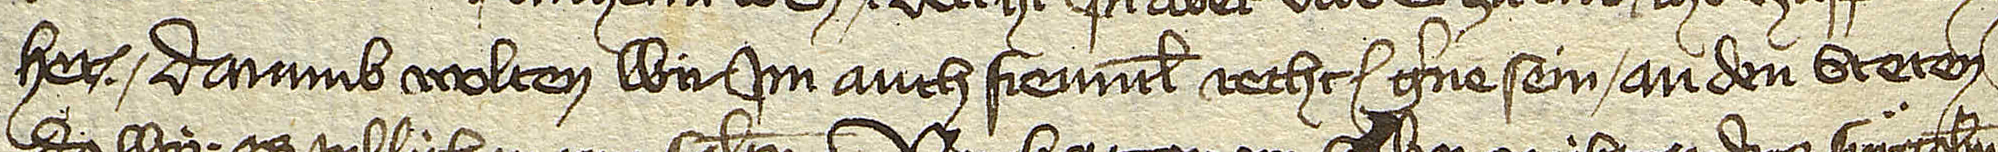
het* . / darumb wolten wir Im auch freuntl* recht g*ne ſein / an den Steten
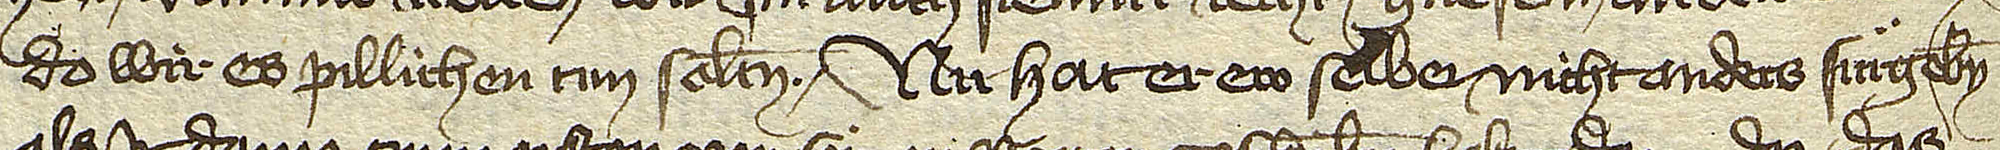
do wir es pillichen tun ſoltn* . / Nu hat er ew ſelber nicht anders fürgebn*
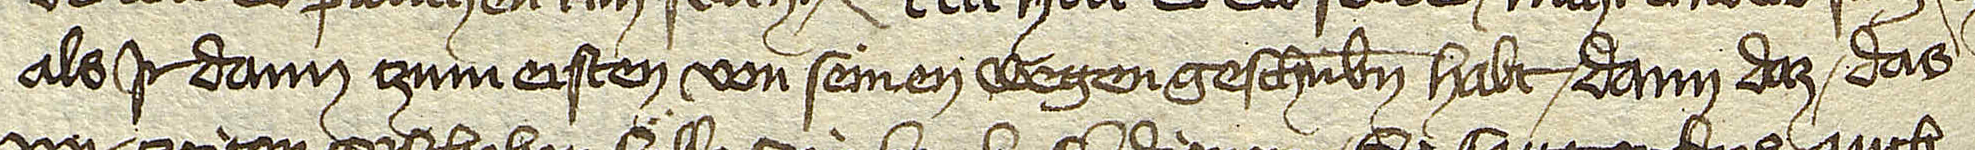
als Ir dann cʒum erſten von ſeinen wegen geſchribn* habt / dann daʒ / das
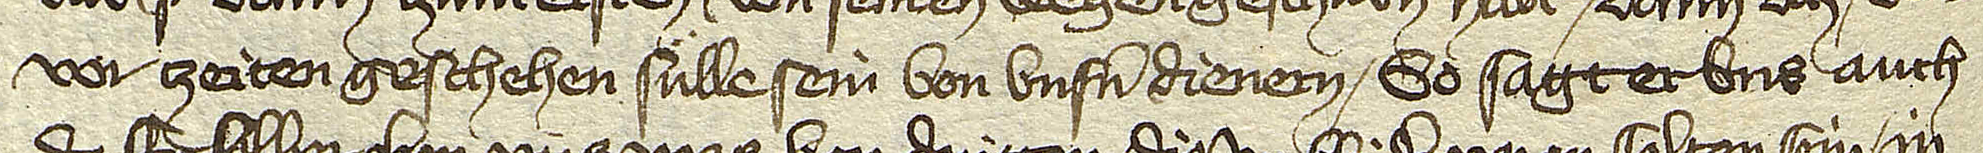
vor cʒeiten geſchehen ſülle ſein von vnſn* dienern / So ſagt vns auch
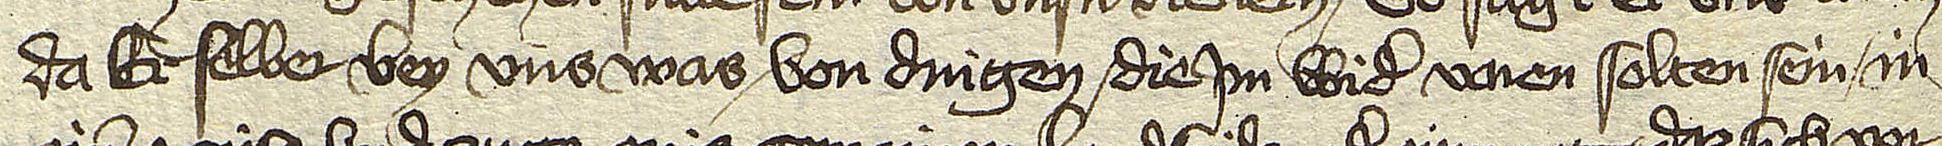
da Er ſelber bey vns was / von dingen / die In wid* varen ſolten ſein / in
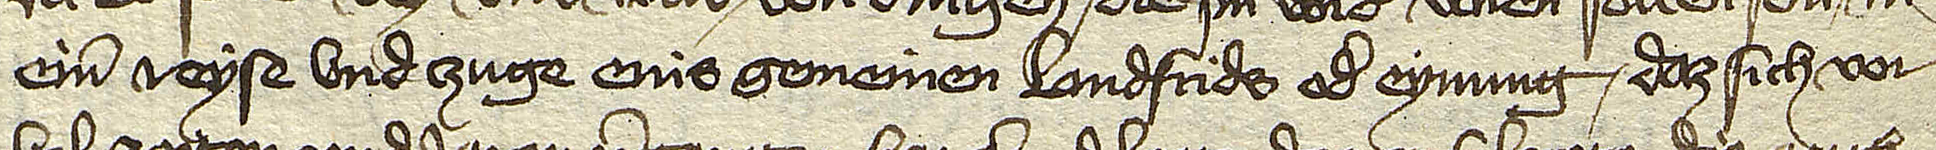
ein* reyſe vnd cʒuge eins gemeinen Landfrids od* eynung / daʒ ſich vor
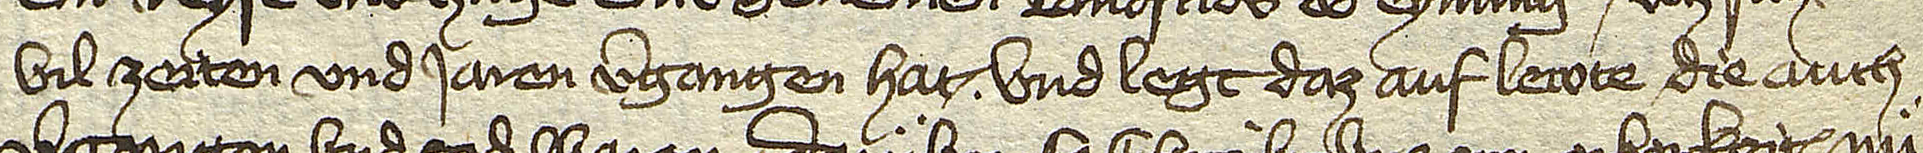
vil cʒeiten vnd Iaren v*gangen hat / . vnd legt daʒ auf lewte die auch
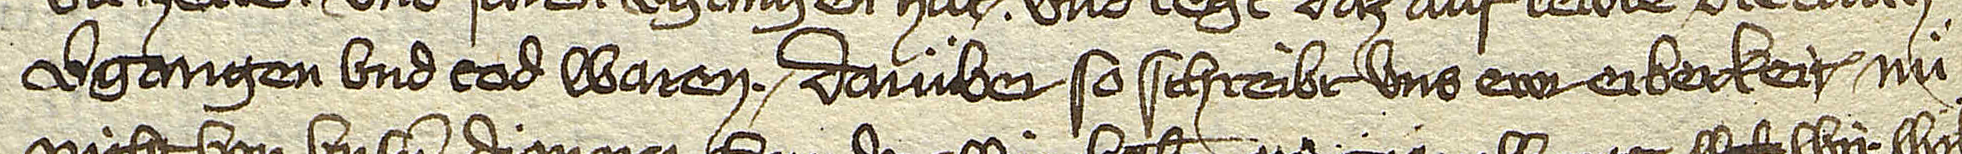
v*gangen vnd tod waren . / darüber ſo ſchreibt vns ewr erberkeit* nü
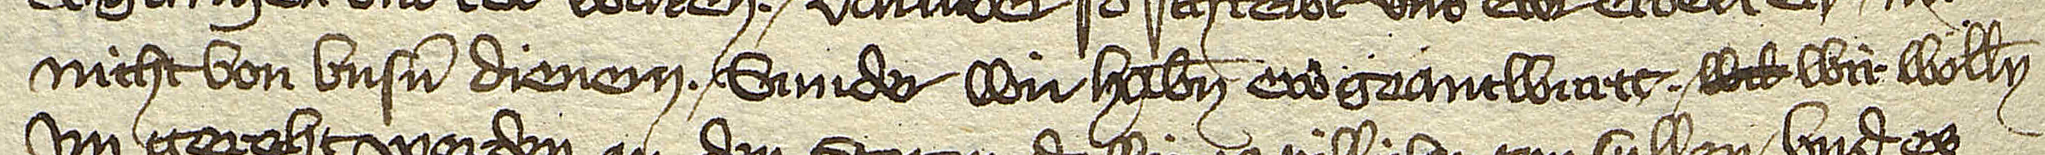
nicht von vnſn* dienern . / Sunder wir habn* ew geantwurtt ./ wil wir wölln*
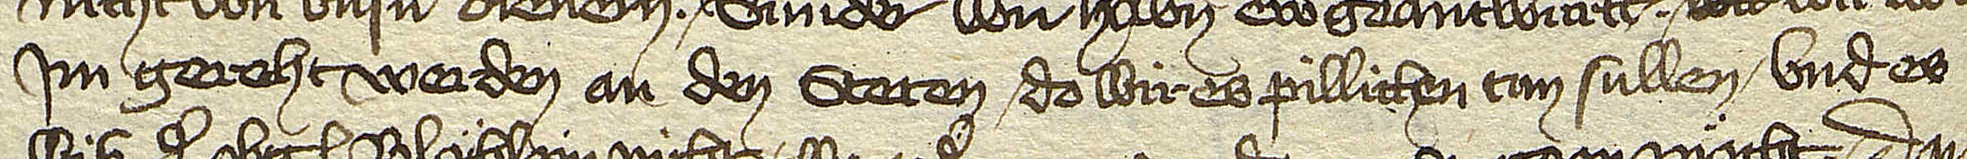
Im gereht werden an den Steten / do wir es pillichen tun ſullen / vnd es
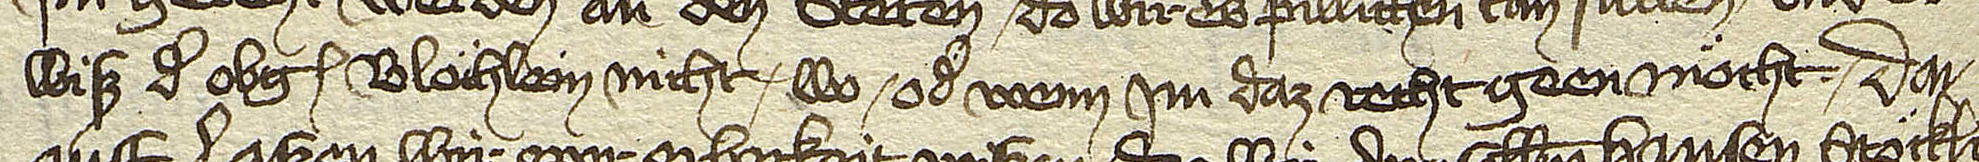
wiſʒ d* obg* Blöchlein nicht / wo / od* wenn Im daʒ recht geen möcht . / Dar
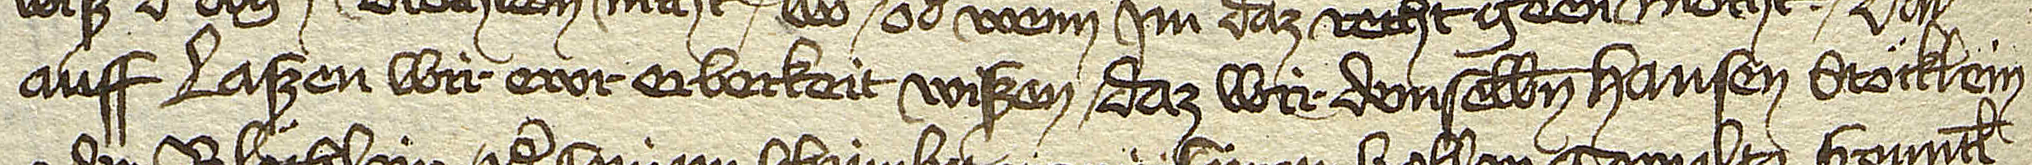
auff Laſʒen wir ewr erberkeit wiſʒen / daʒ wir demſelbn* Hanſen Stöcklein
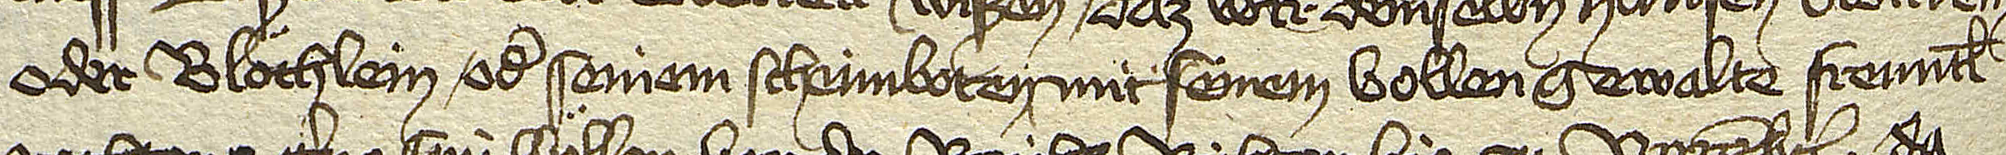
oder Blöchlein / od* ſeinem ſcheimboten mit ſeinem vollen gewalte freuntl*
